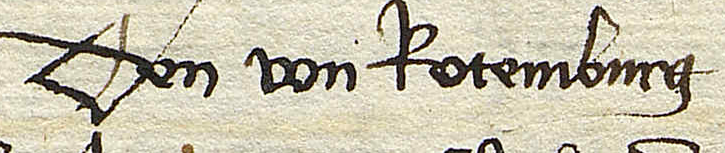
Den von Rotemburg
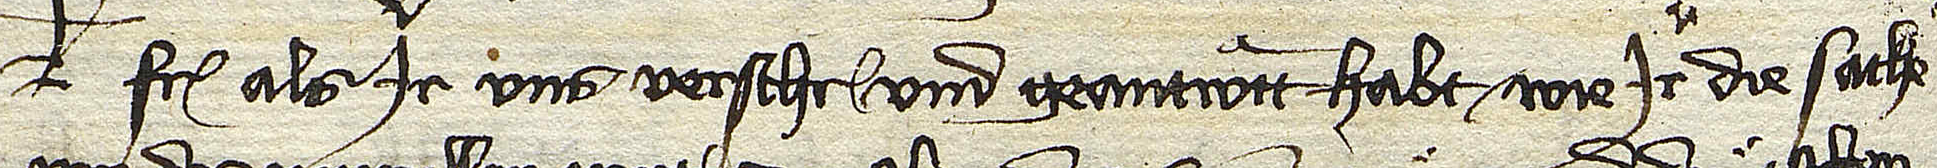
L* fr* als Ir vns verſchr* vnd geantw*tt habt / wie Ir die ſache
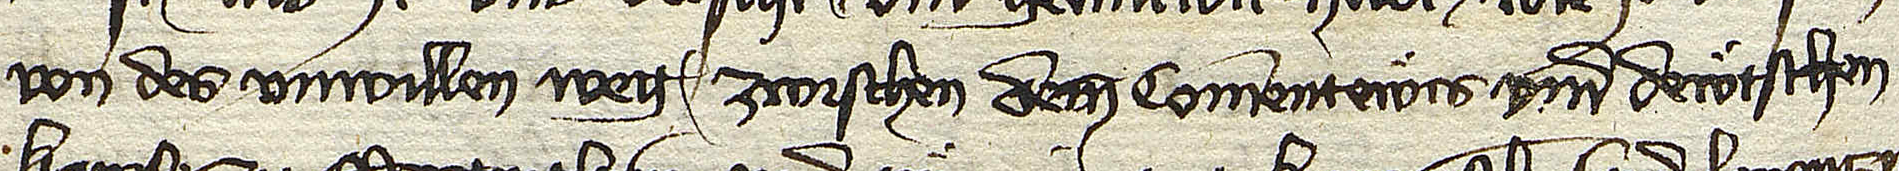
von des vnwillen weg* ʒwiſchen dem Comentewrs* vnd dewtſchen
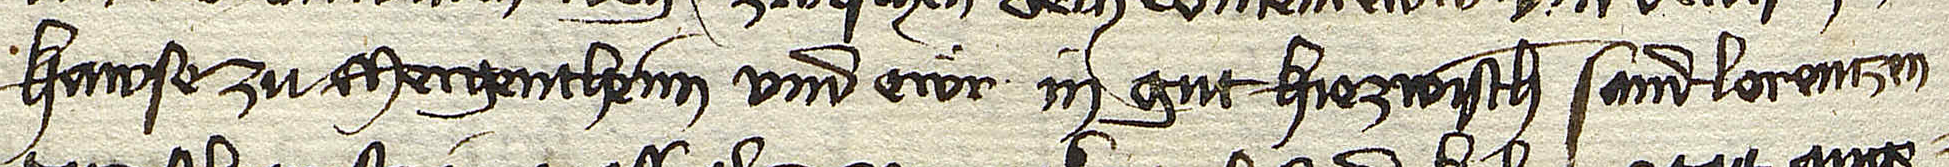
hawſe ʒu Mergentheim vnd ewr in gut hieʒwiſch* ſand lorencʒen
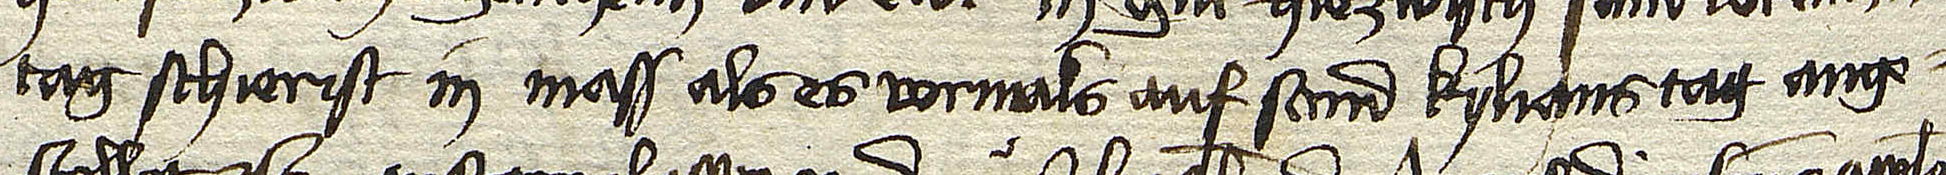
tag ſchieriſt in maſſ als es vormals auf ſand kylians tag ange =
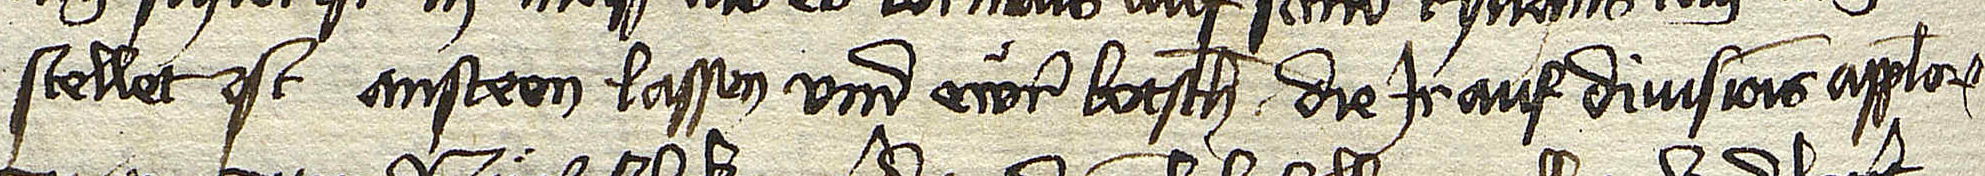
ſtellet iſt anſteen laſſen vnd ew*r botſch* . die Ir auf diuiſio*is applo*
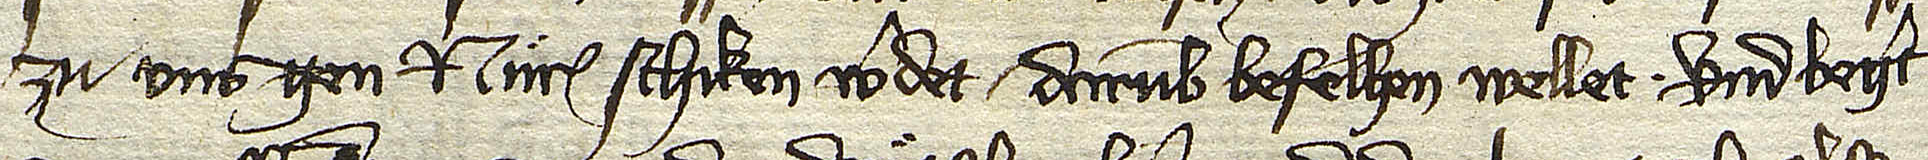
ʒu vns gen Nür* ſchiken w*det / daru*b befelhen wellet . Vnd beg*t
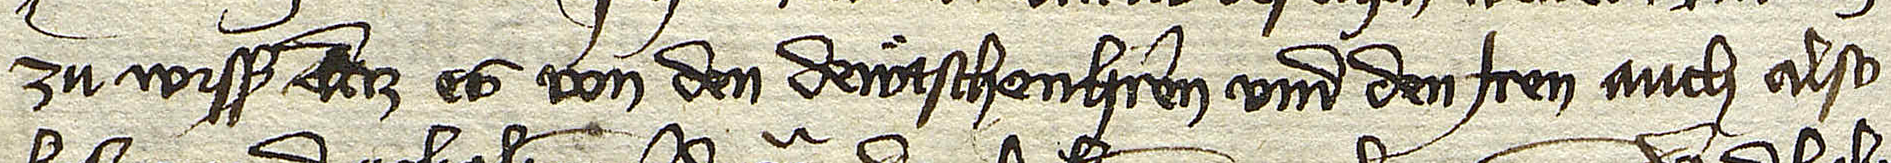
ʒu wiſſ* daʒ es von den dewtſchenh*ren vnd den Iren auch alſo
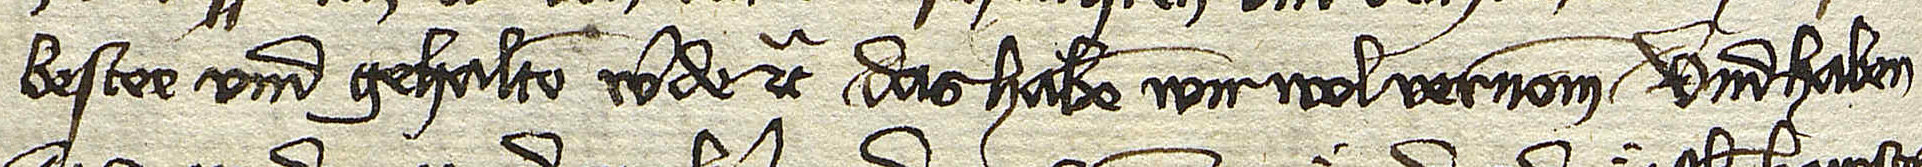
beſtee vnd gehalte* w*de ec* / das habe* wir wol vernom* / Vnd haben
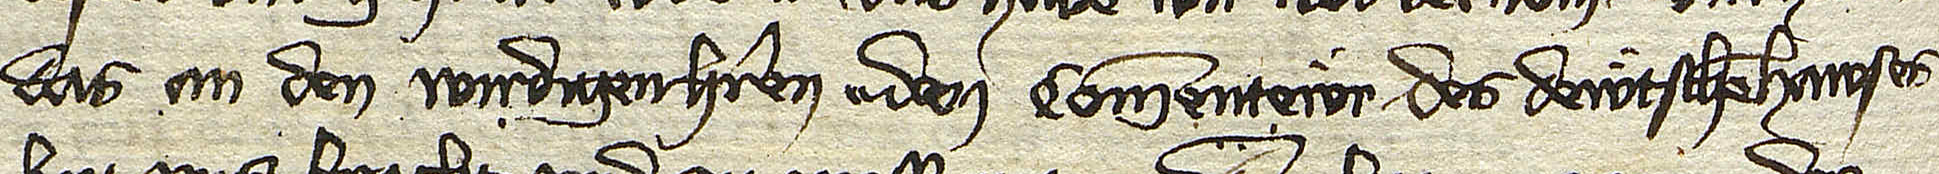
das an den wirdigen h*ren ~ den Comentewr des dewtſche* hawſes
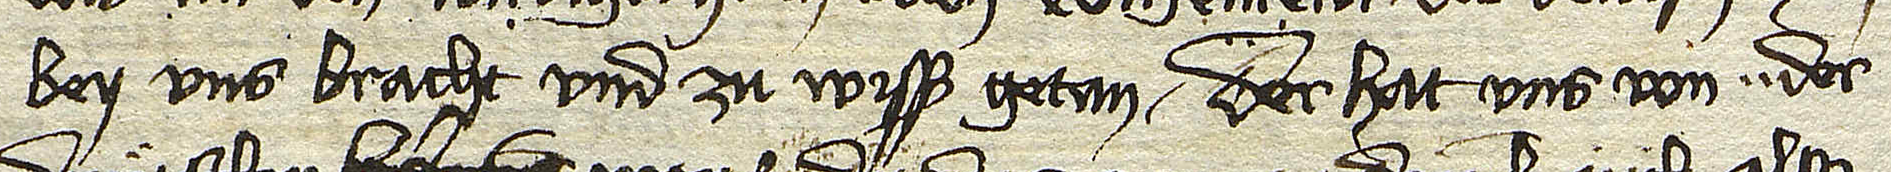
bey vns bracht vnd ʒu wiſſ* getan / Der hat vns von ~ der
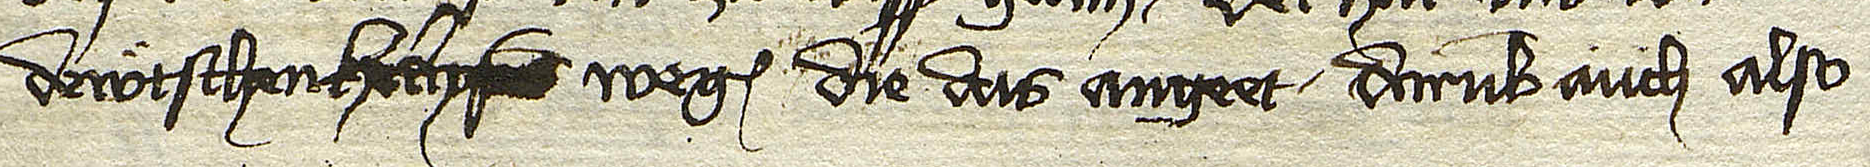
dewtſchen hawſes weg* die das angeet / daru*b auch alſo
